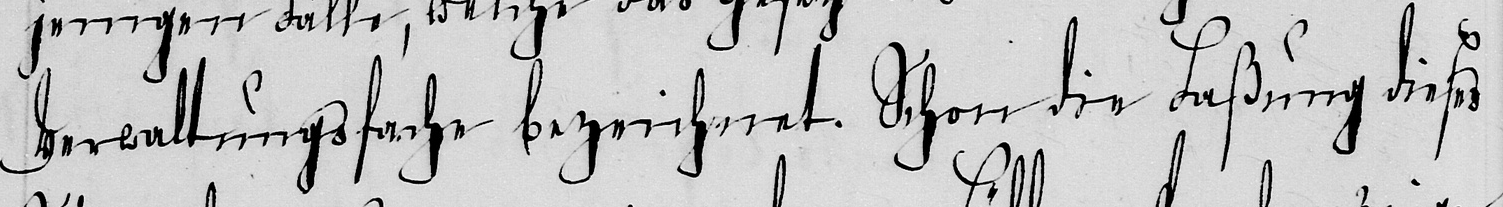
Verwaltungsfache bezeichnet. Schon die Faßung dieses
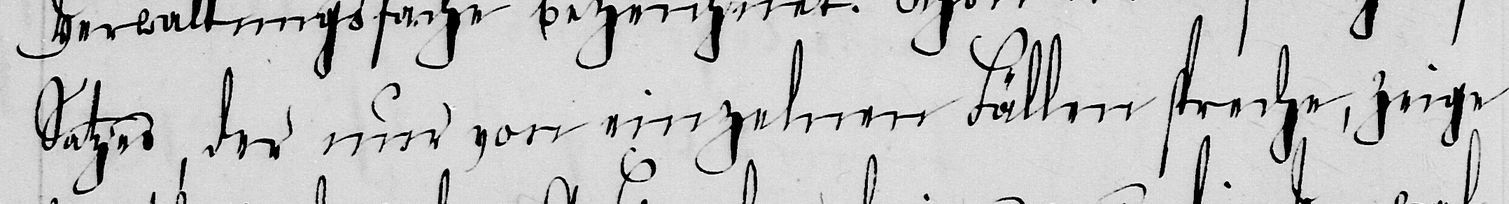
Satzes, der nur von einzelnen Fällen spreche, zeige
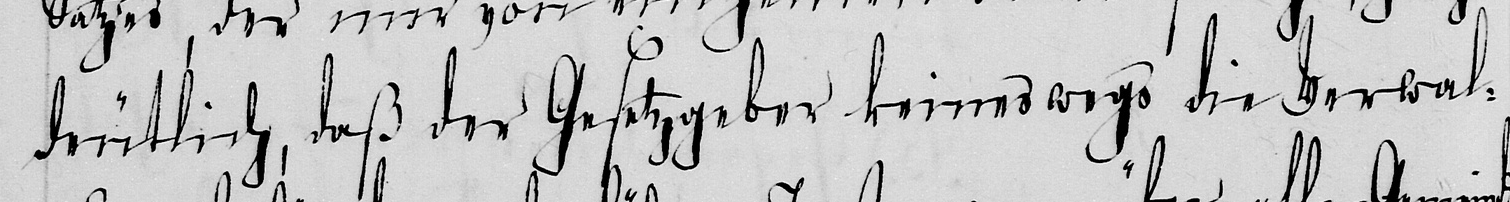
deutlich, daß der Gesetzgeber keineswegs die Verwal¬
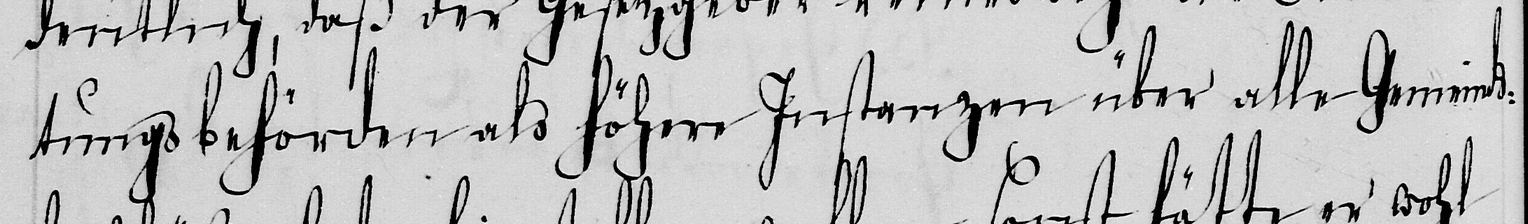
tungsbehörden als höhere Instanzen über alle Gemei¬
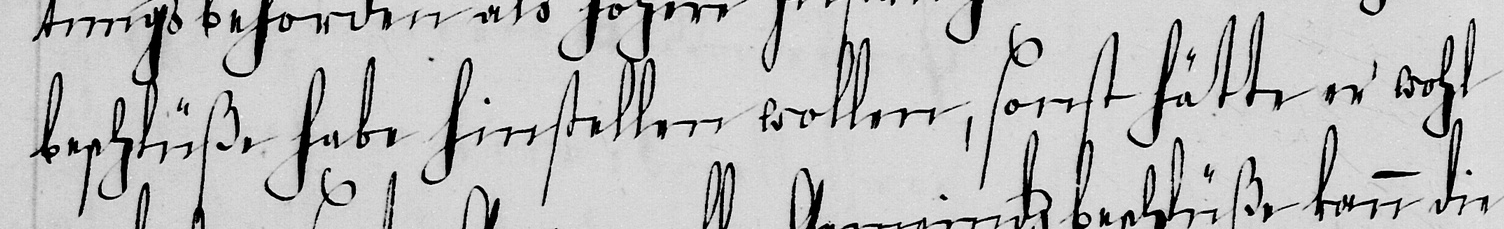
beschlüße habe hinstellen wollen, sonst hätte er wohl
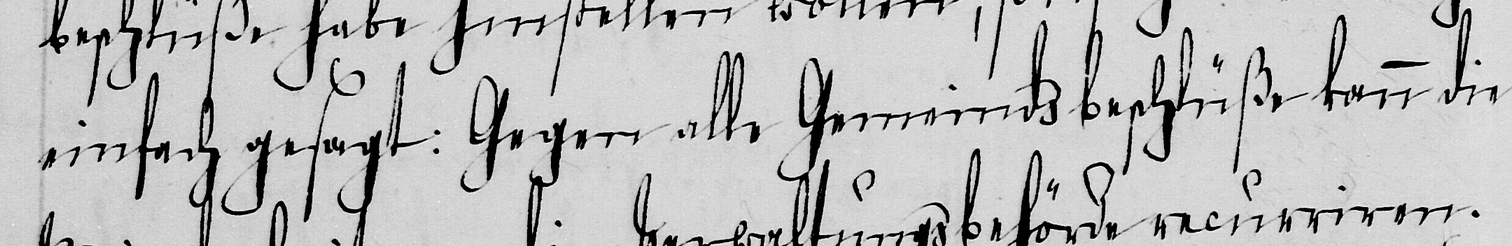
einfach gesagt: Gegen alle Gemeindsbeschlüße kann d¬
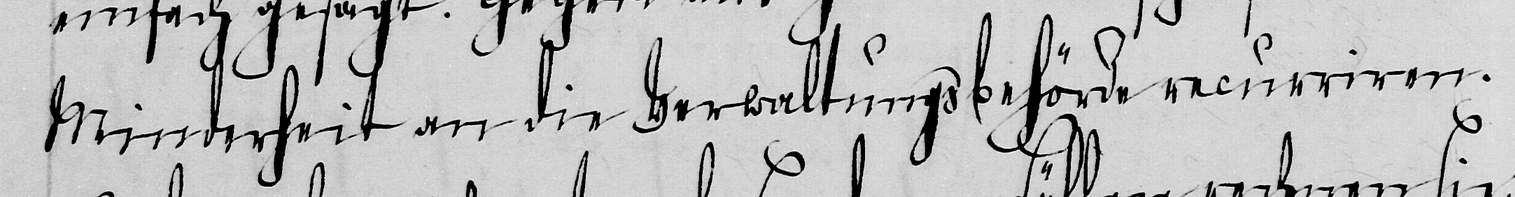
Minderheit an die Verwaltungsbehörde recurriren.
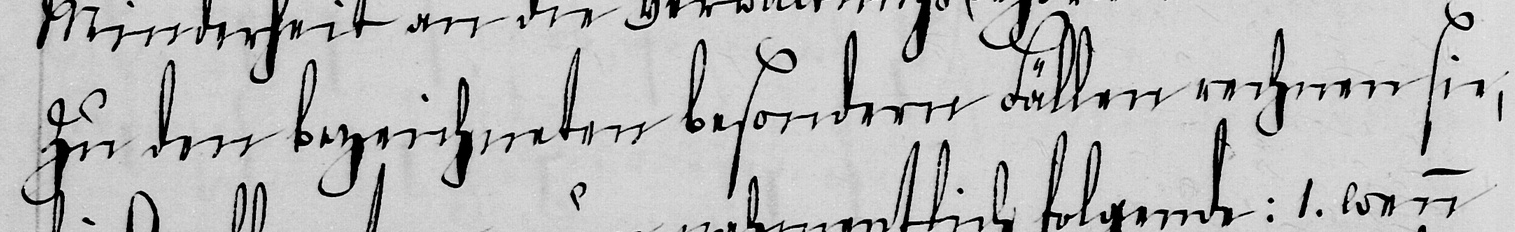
Zu den bezeichneten besondern Fällen rechnen sie,
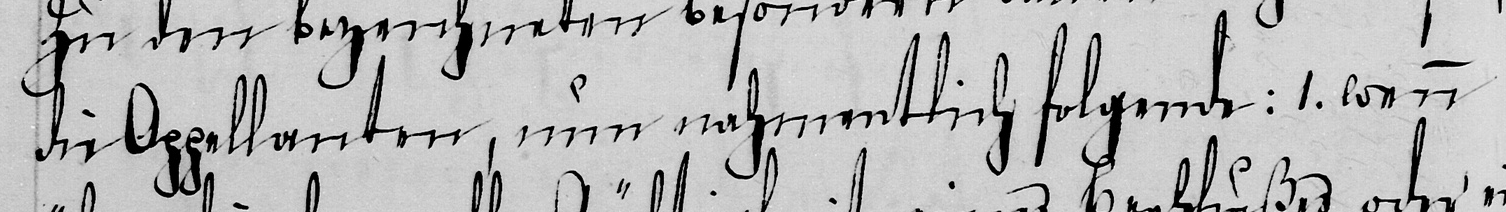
die Appellanten, nun nahmentlich folgende: 1.) wenn
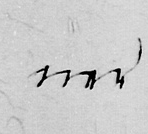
dieser
